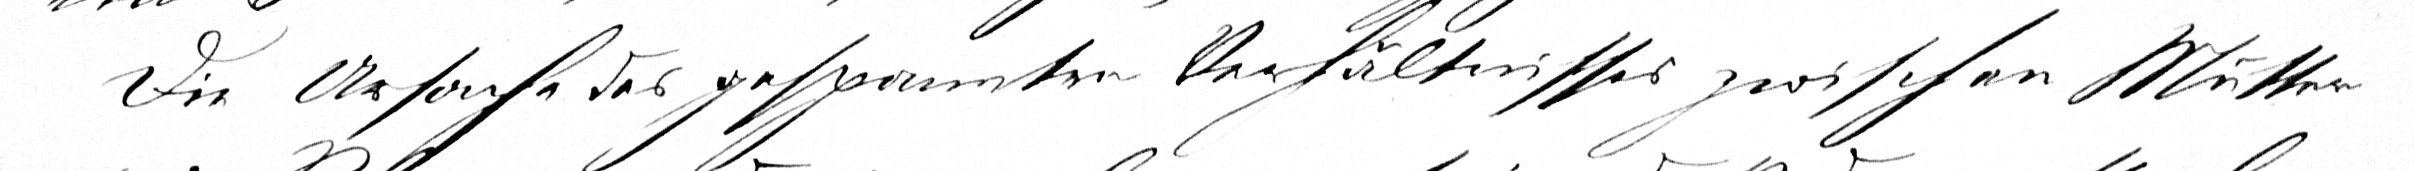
Die Ursache des gespannter Verhältnisses zwischen Mutter
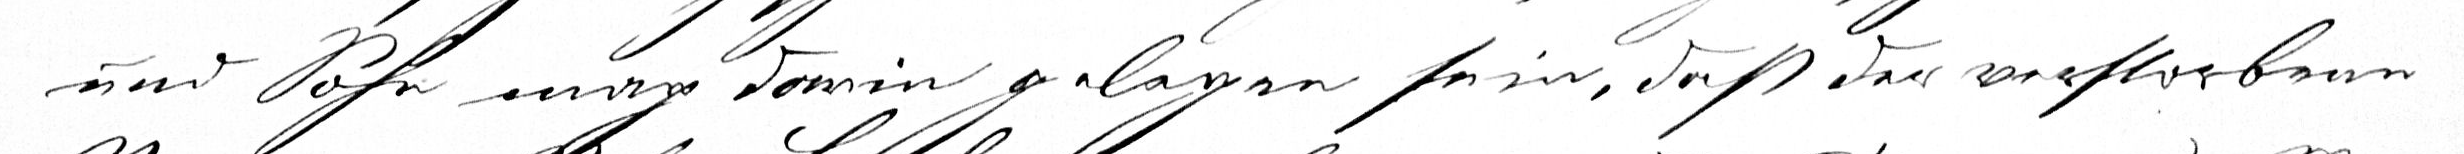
und Sohn mag darin gelegen sein, daß der verstorben
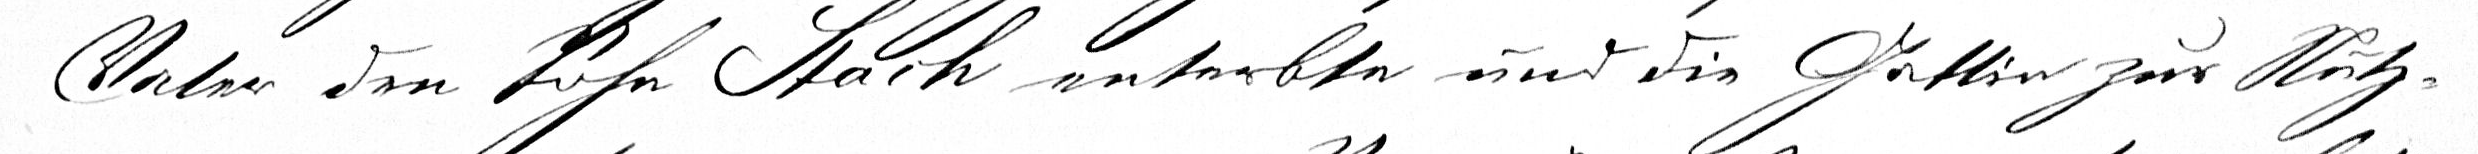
Vater den Sohn Stach enterbte und die Gattin zur Nutz¬
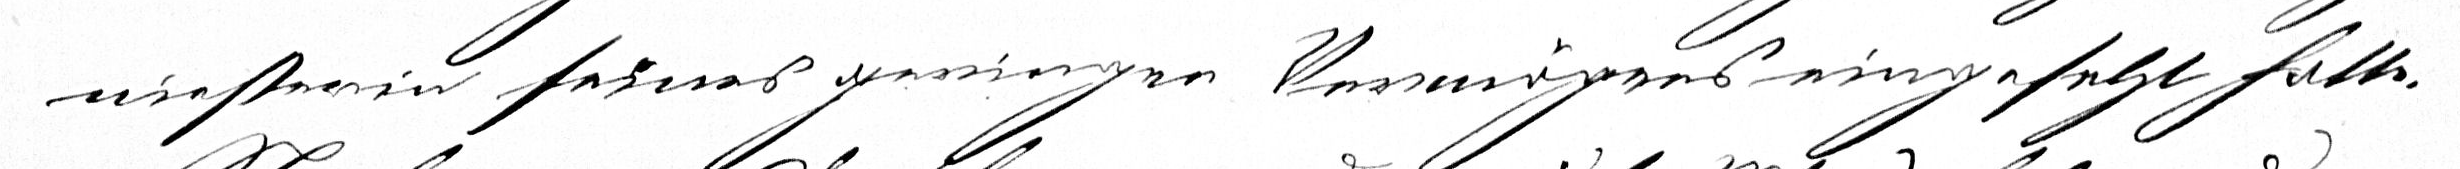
nießerin seines geringer Vermögens eingesetzt hatte.
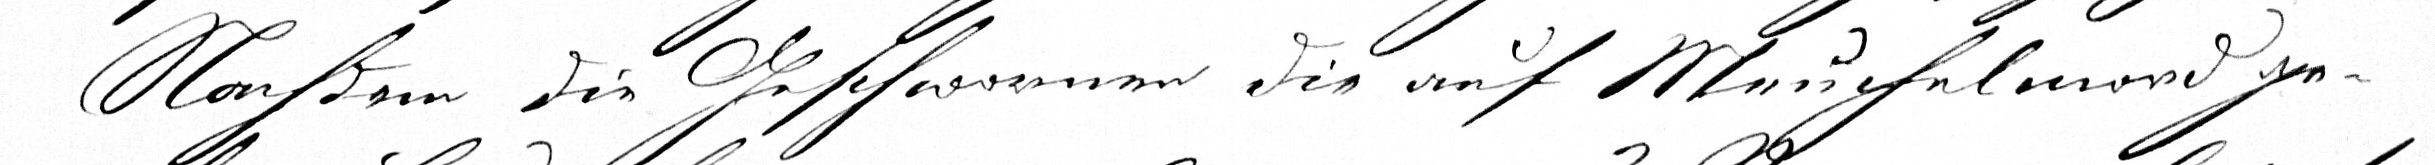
Nachdem die Geschworner die auf Meuchelmord ge¬
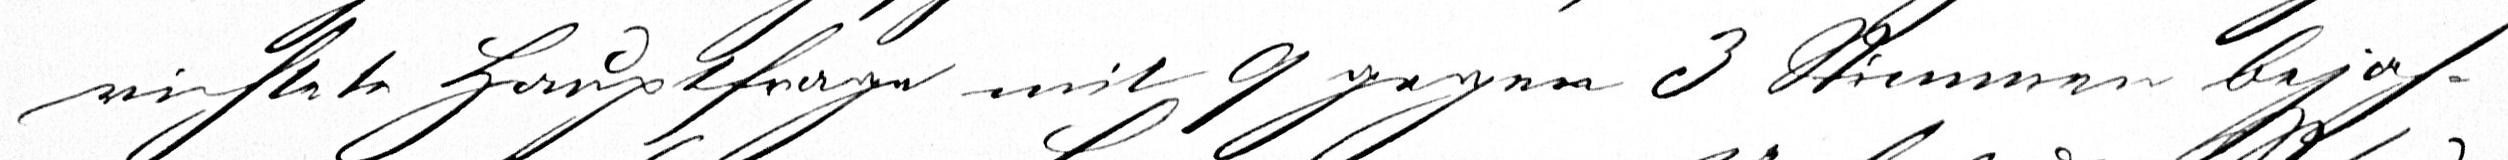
richtete Hauptfrage mit 9 gegen 3 Stimmen bejah¬
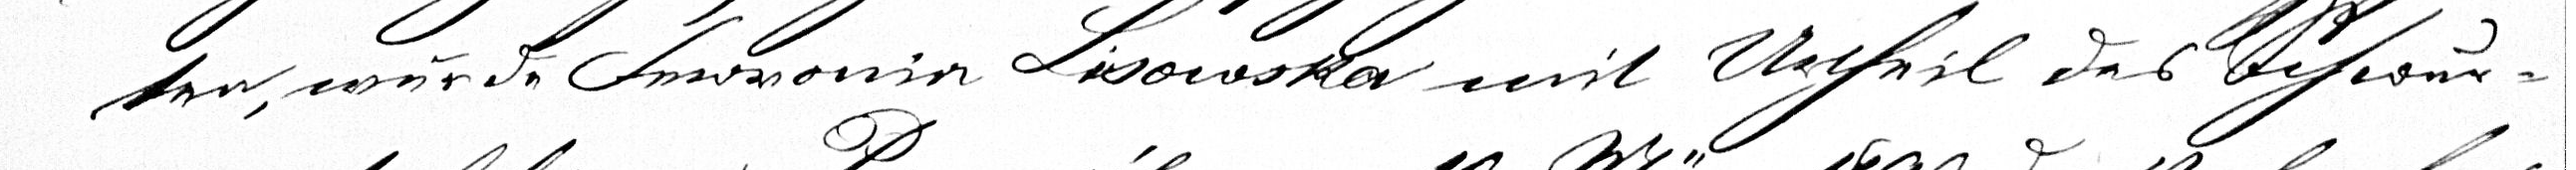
ter, wurde xx Lisowska mit Urtheil des Schwur¬
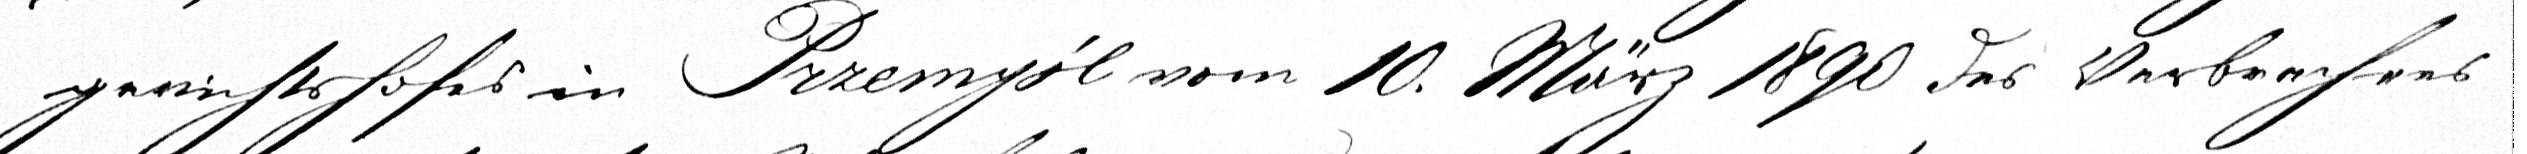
gerichtshofes in Przemgil vom 10 März 1890 des Verbrechers
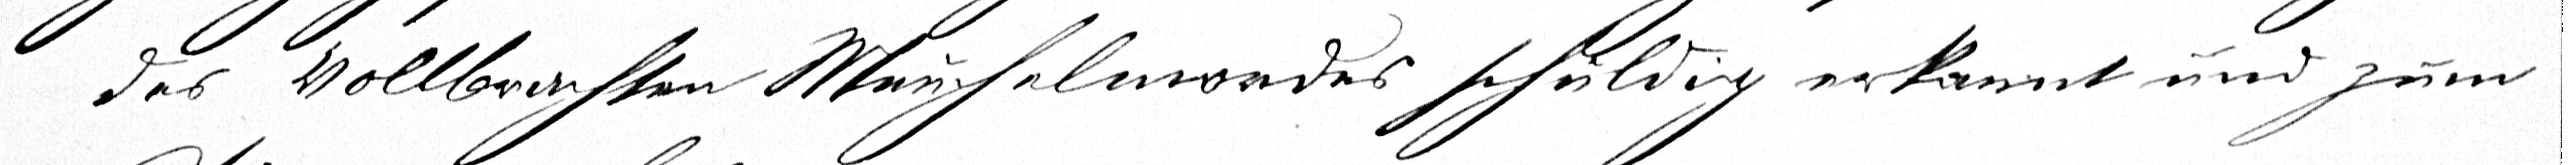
des Vollbrachten Meuchelmordes schuldig erkannt und zum
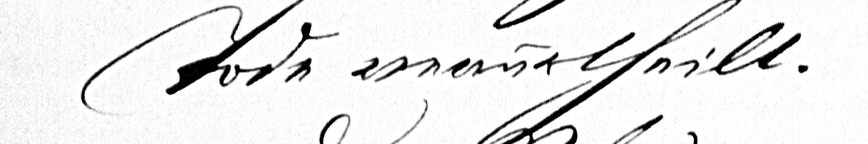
Tode verurtheilt.
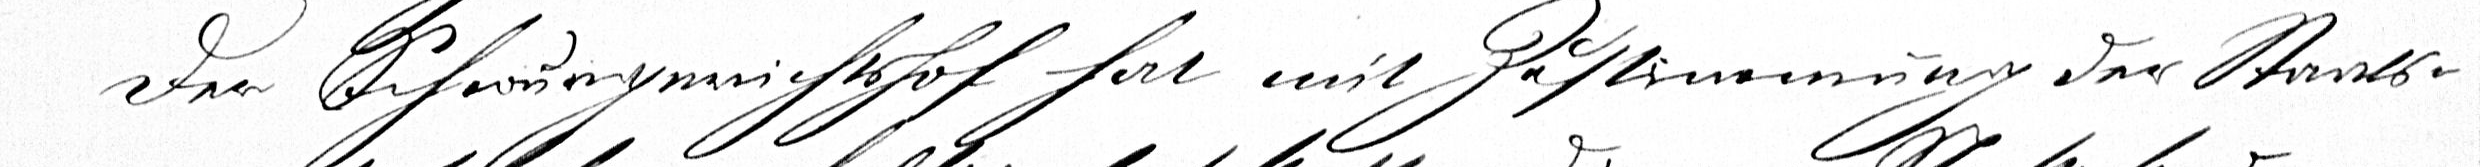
Der Schwurgerichtshof hat mit Zustimmung der Staats¬
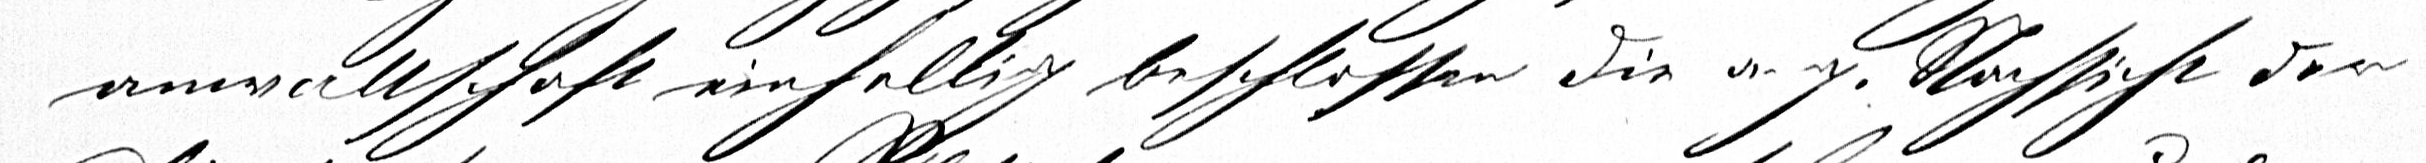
anwaltschaft einfellig beschlossen die a. g. Nachsicht der
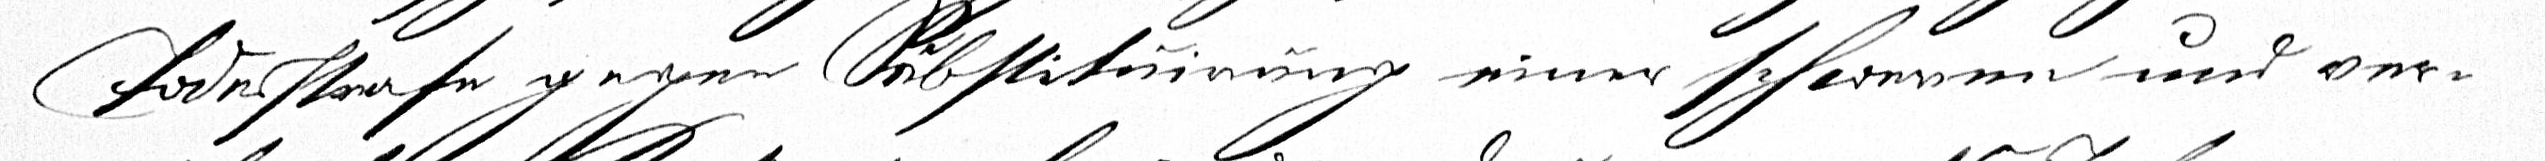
Todesstrafe gegen Substituirung einer schweren und ver¬
